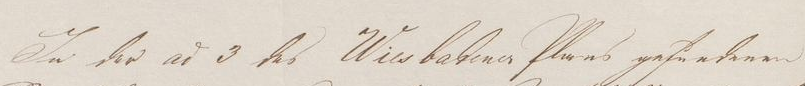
In der ad 3 des Wiesbadener Plans gefundenen
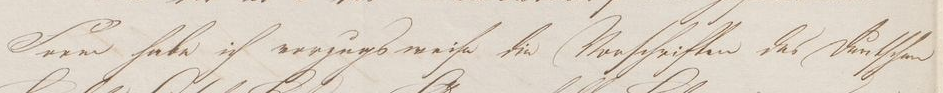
Form habe ich vorzugsweise die Vorschriften des deutschen
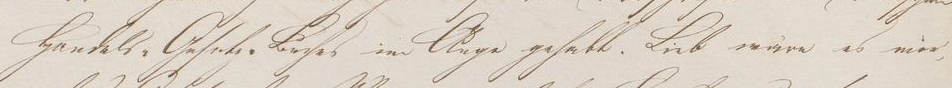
Handels-Gesetz-Buches im Auge gehabt. Lieb wäre es mir,
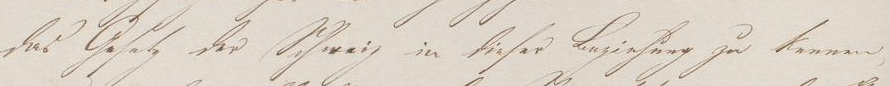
das Gesetz der Schweiz in dieser Beziehung zu kennen,
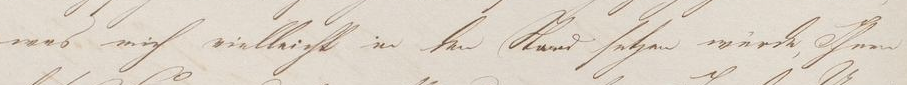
was mich vielleicht in den Stand setzen würde, Ihnen
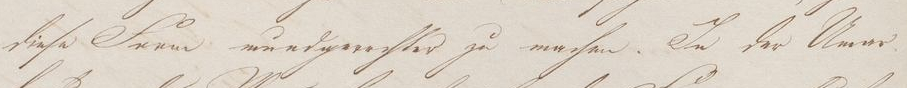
diese Form mundgerechter zu machen. In der Umar-
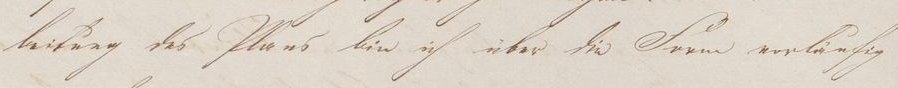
beitung des Plans bin ich über die Form vorläufig
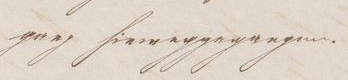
ganz hinweggegangen.
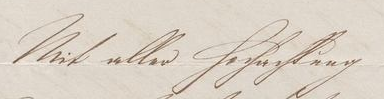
Mit aller Hochachtung
